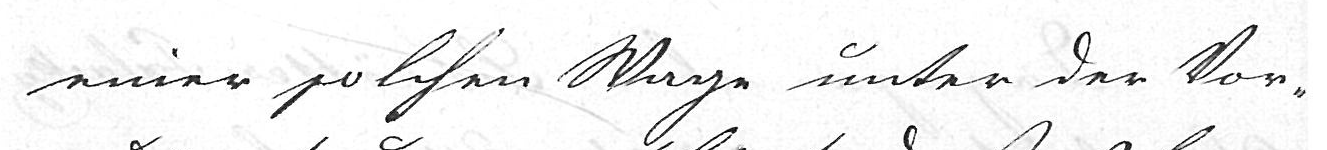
einer solchen Wage unter der Vor-
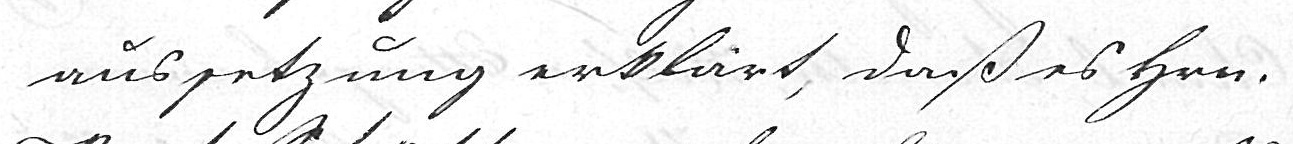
aussetzung erklärt, daß es Hrn.
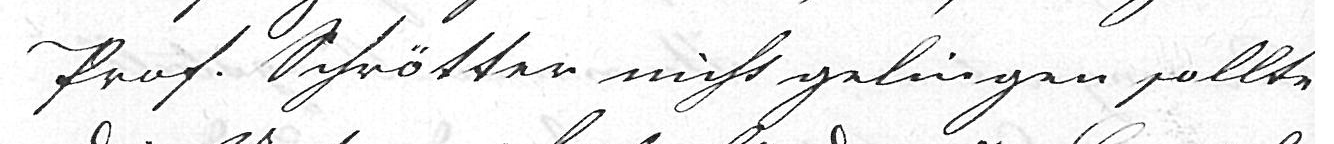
Prof. Schrötter nicht gelingen sollten
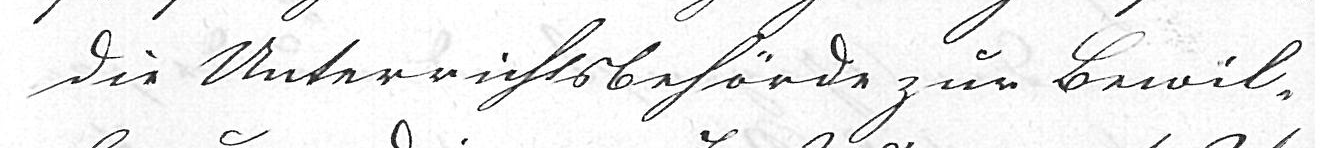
die Unterrichtsbehörde zur Bewil-
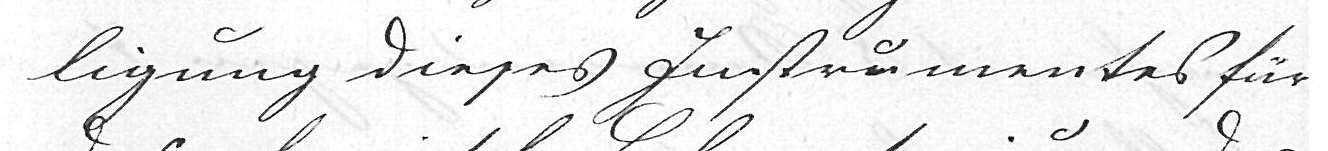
ligung dieses Instrumentes für
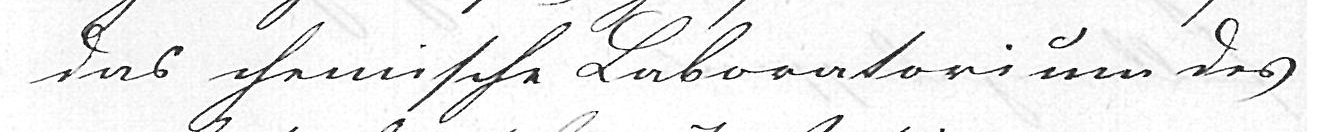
das chemische Laboratorium des
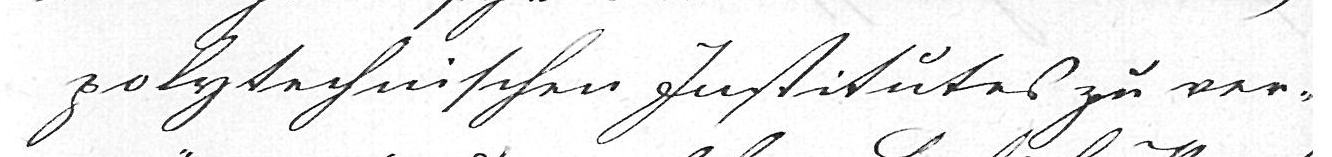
polytechnischen Institutes zu ver-
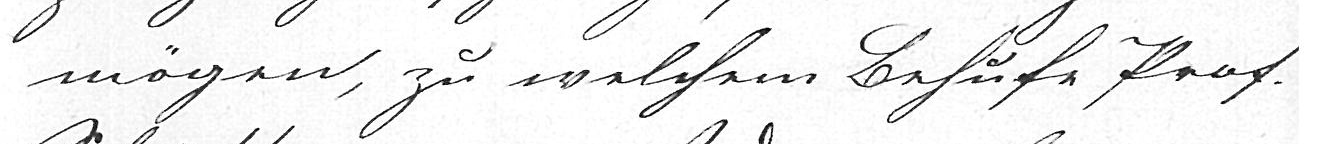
mögen, zu welchem Behufe Prof.
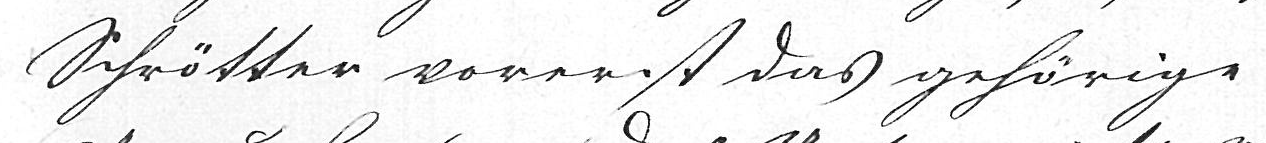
Schrötter vorerst das gehörige
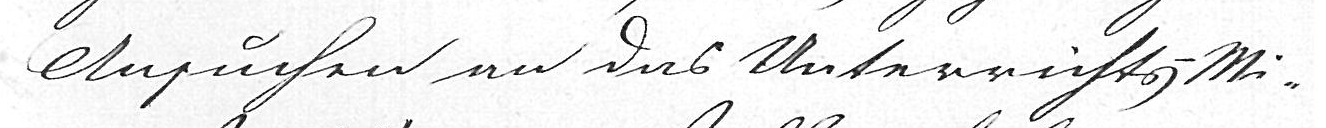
Ansuchen an das Unterrichts-Mi-
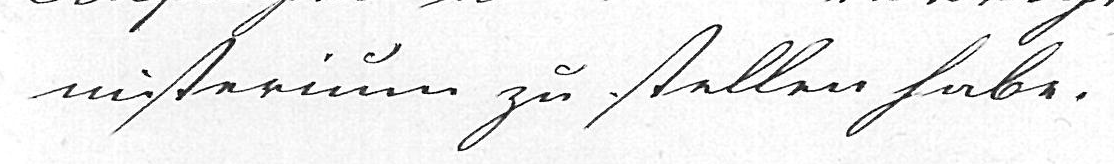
nisterium zu stellen habe.
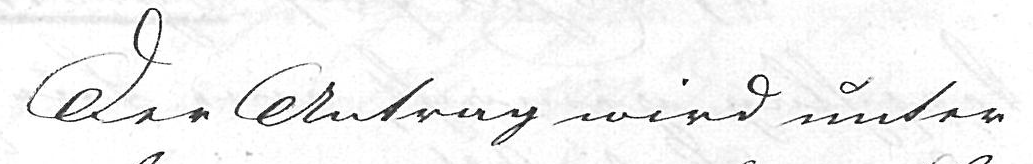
Der Antrag wird unter
